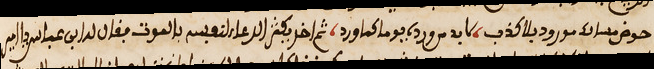حوض مسالك مورود بلا كذب لا بد من وردة يوما كما ورد ثم اخر يكثر الدعاء لنفسه بالموت فقال له ابن عباس يا امير
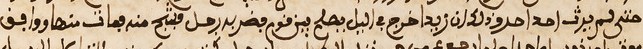حتى لم يرث احد احد وذلك ان زيد اخرج في اليل يصلح بين قوم فضربه رجل فشبح منه فمات منها و وافق
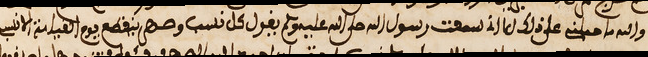والله ما حملنى على ذلك الا انى سمعت رسول الله عليه وسلم يقول كل نسب وصهر ينقطع يوم القيامة الا نسبى
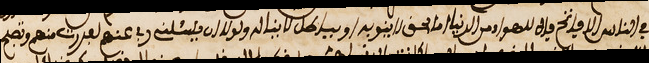في الناس الا فاتح فاه للهواء من الدنيا اما بحق لا ينوبه او بباطل لا يناله ولو لا ان يسئلنى ربى عنهم لفررت منهم وتصبح
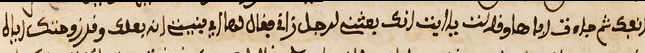انفك ثم جاءت ابا هاو قالت يا ايت انك بعثنى لرجل زانى فقال لها اي بنيتى انه بعلك وقد زوحتك اياه
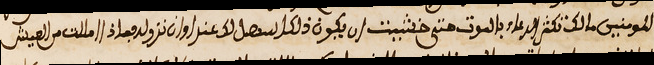المومني نكا لك تكثر الدعاء بالموت حتى خشيت ان يكون ذلك اسهل لك عند او ان نزوله فماذ اامللك من العيش
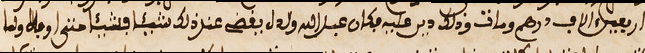اربعين ءالاف درهم ومات وذلك دين عليه فكان عبد الله ولده يقضى عند ذلك شيئا فشيئا حتى اوفاه ولما
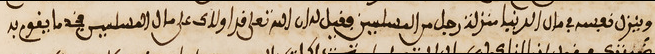وينزل نفسه في مال الدنيا منزلة رجل من المسلمين فقيل له ان الله تعلى قد او لاك على مال المسلمين فخد ما يقوم به
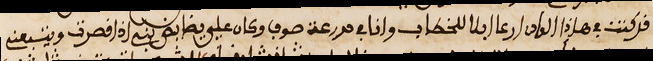قد كنت في هاذا الوادى ارعا ابلا للخطاب وانا في مررعة صوف وكان علي يضايض بنى اذا قصرت ويتبعنى
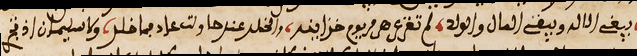يبقى الاله ويبقى المال والولد لم تغن عن هر مريوم خزاينه والخلد عند حاولت عاد فما خلدو لا سليمان اذ تجرى
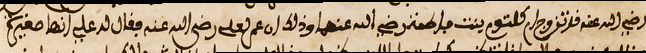رضي الله عنه قد تزوج ام كلتوم بنت فاطمة رضي الله عنهما وذلك ان عمر لعلى رضى الله عنه فقال له علي انها صغيرة
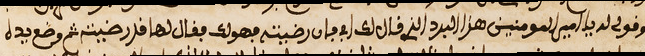وقولى له يا امير المومنين هذا البرد الذي قال لك ابى فان رضيته فهولك فقال لها قد رضيته ثم وضع يده
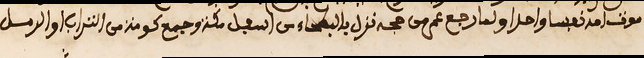موت امه نفسا واحد او لما رجع عمر من حجه نزل بالبطحاء من السفل مكة وجمع كومة من التراب او الرمل
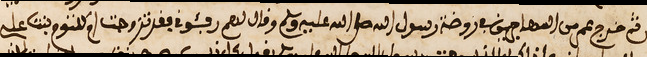ثم خرج عمر من المهاجرين في روضة رسول الله صلى الله عليه وسلم وقال لهم رفؤ نى فقد تزوجت ام كلتوم وبنت على
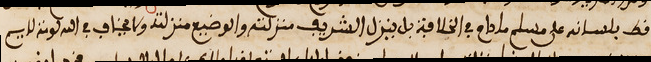قط بلسانه على مسلم مادام في الخلافة بل ينزل الشريف منزلته والوضيع منزلته ولا يخاف في الله لومة لايم
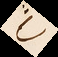ثم
